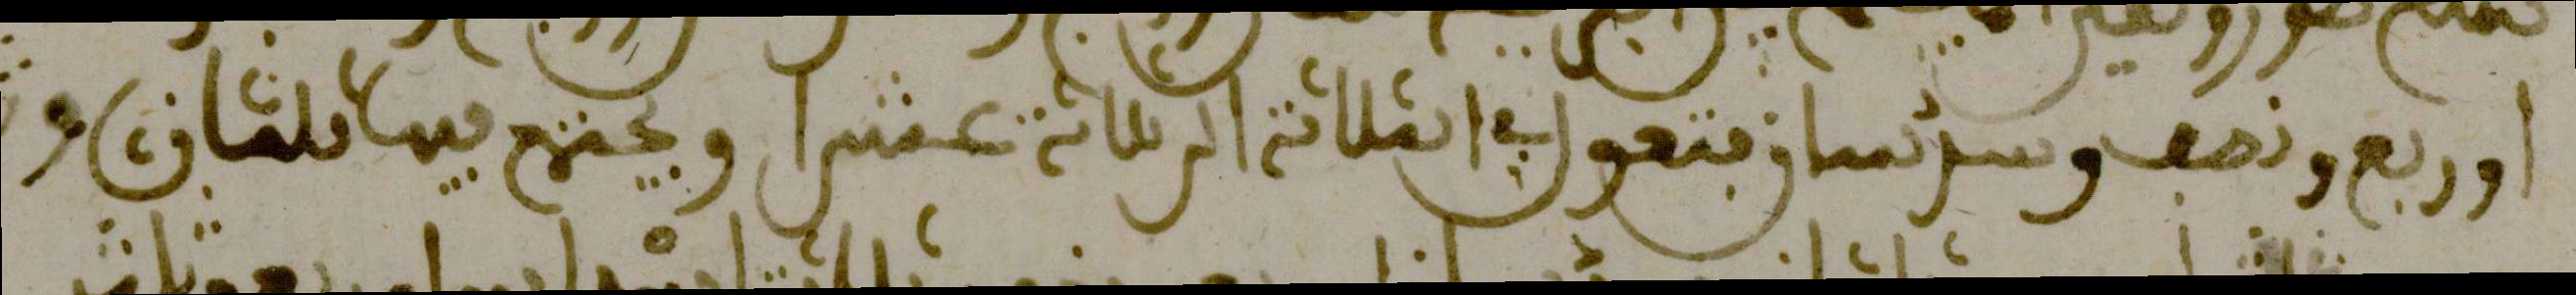او ربع ونصف وسدسان فتعول في الثلاثة الى ثلاثة عشر يجتمع فيها ثلثان
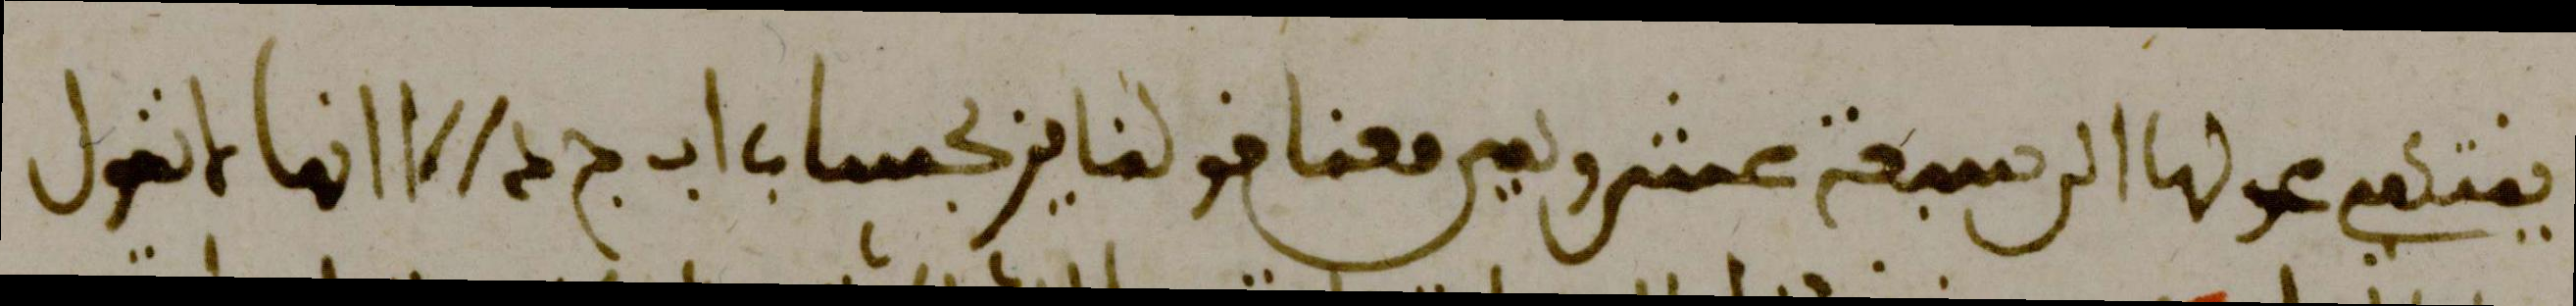ينتهي عولها الى سبعة عشر وهي معنا قولنا يز بحساب ا ب ج د الا انها لا تعول
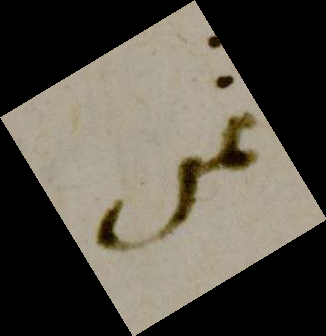ثمن
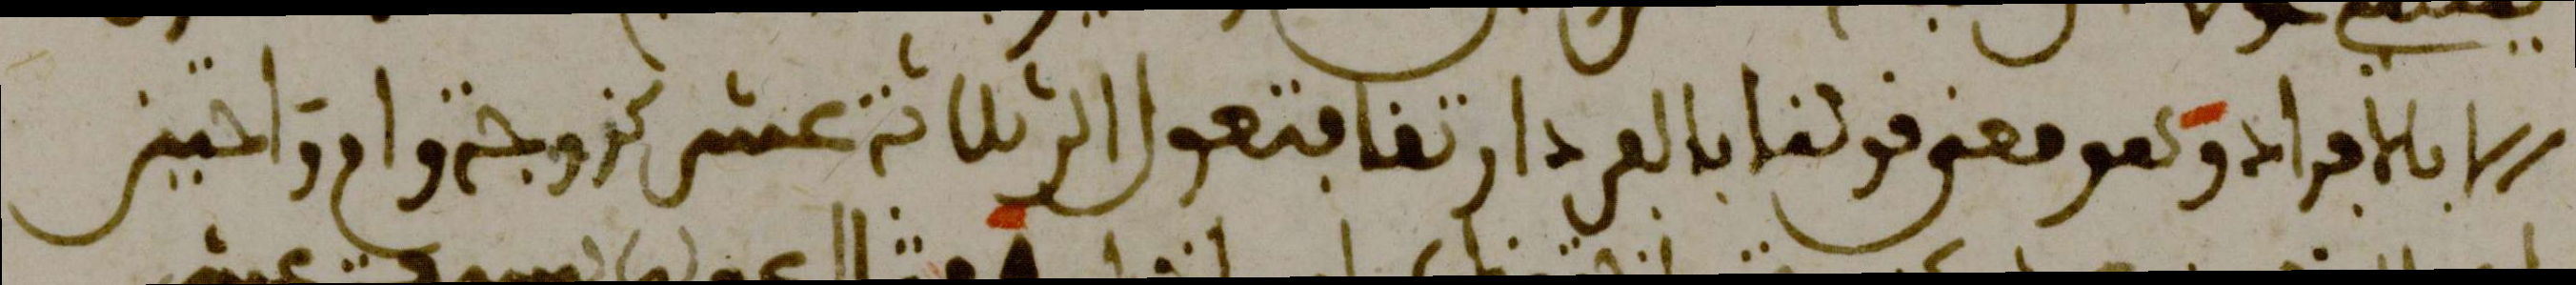الا بالافراد وهو معنى قولنا بالفرد ارتقا فتعول الى ثلاثة عشر كزوجة وام واختين
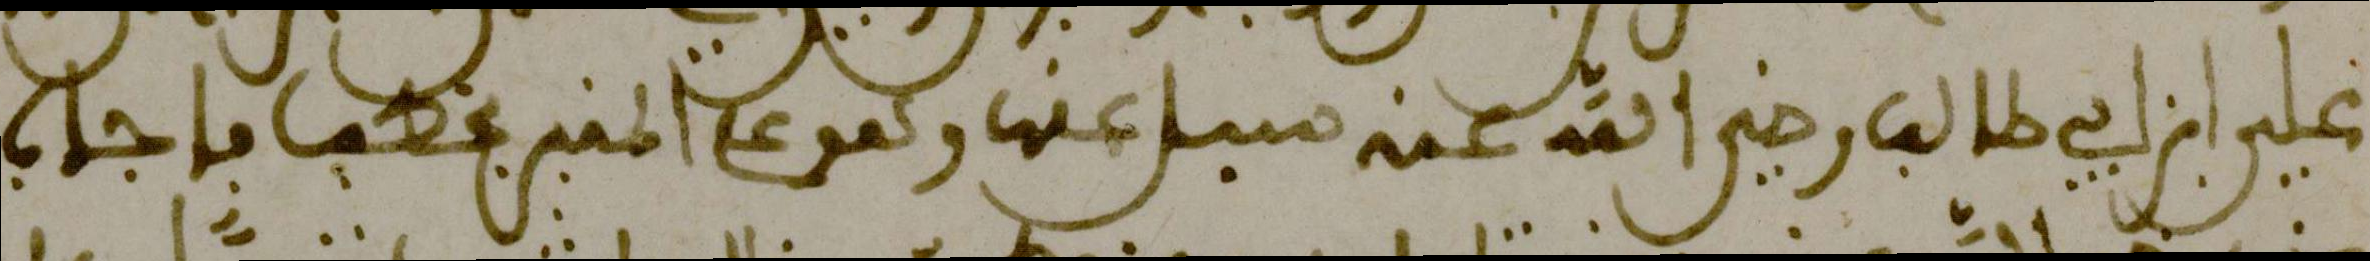علي ابن ابي طالب رضي الله عنه سبل عنها وهو على المنبر يخطب فاجاب
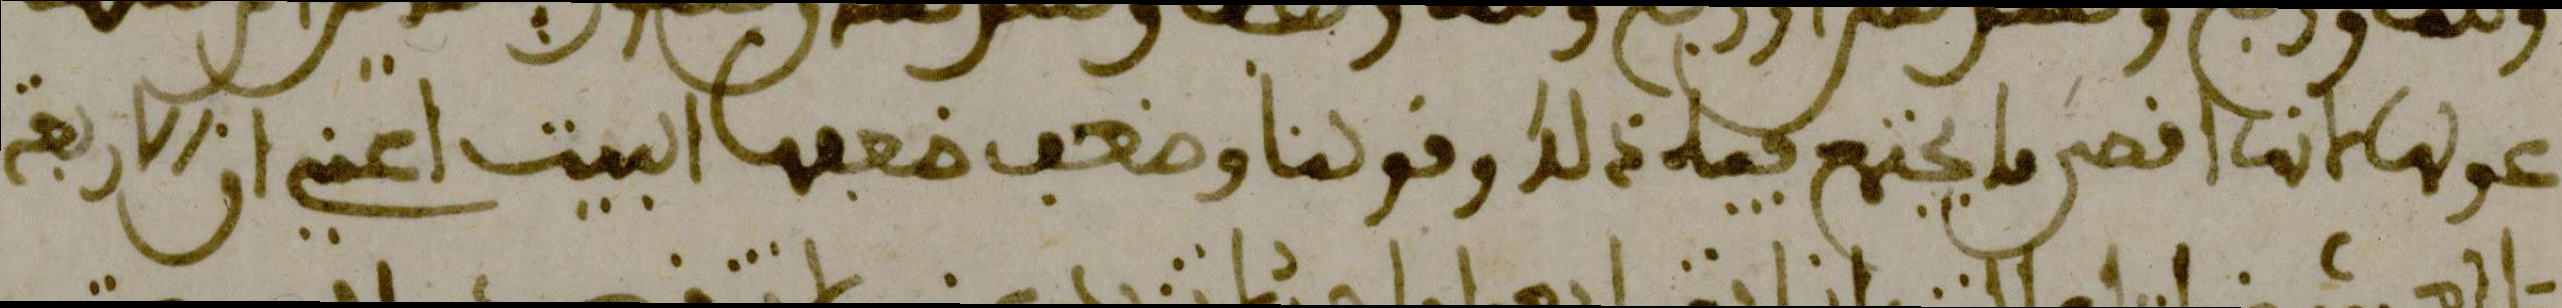عولها لانها اقصى ما يجتمع فيه ذلك وقولنا وضعف ضعفها البيت اعني ان الاربعة
